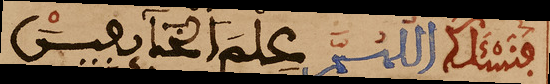فنسئلك اللهم علم الخائفين
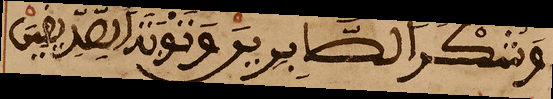وشكر الصابرين وتوبة الصديقين
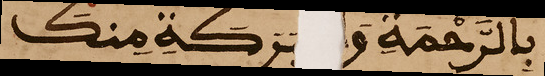بالرحمة والبركة منك
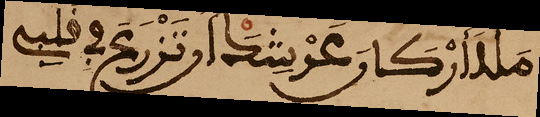ملا أركان عرشك ان تزرع في قلبى
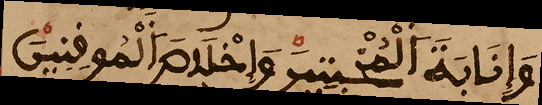وإنابة المخبتين وإخلاص الموقنين
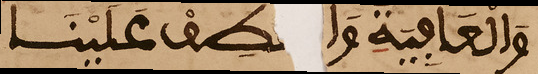والعافية واللطف علينا
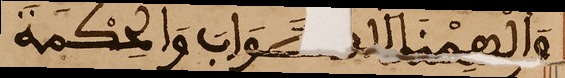وألهمنا الصواب والحكمة
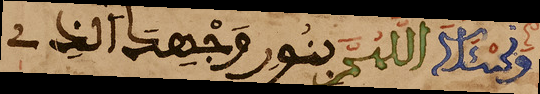ونسئلك اللهم بنور وجهك الذي
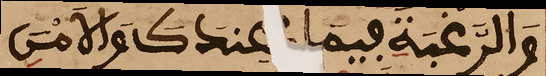والرغبة فيما عندك والامن
